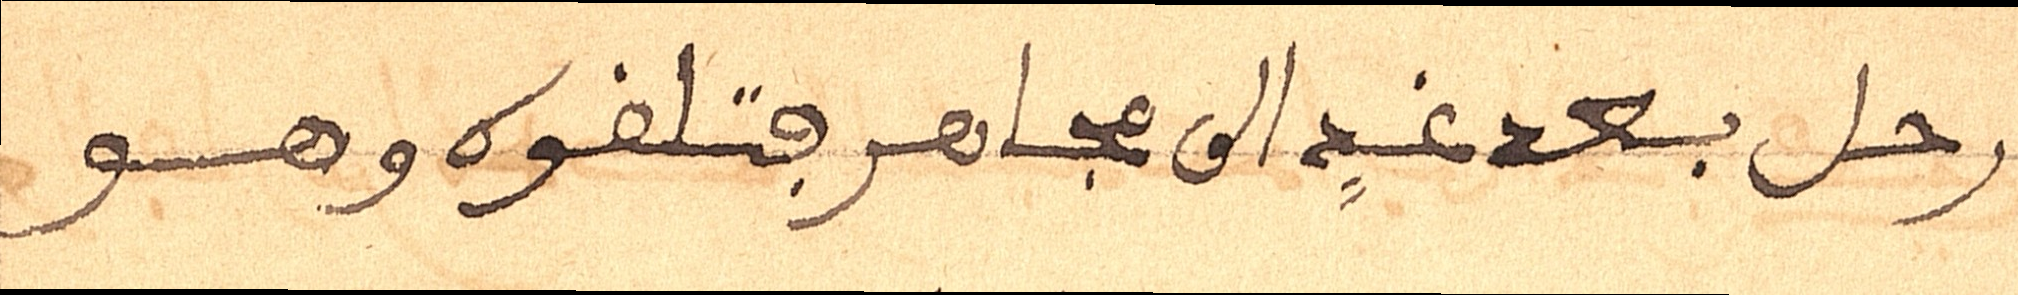رحل بعد غد الى مجاهر فتلقوه وهو
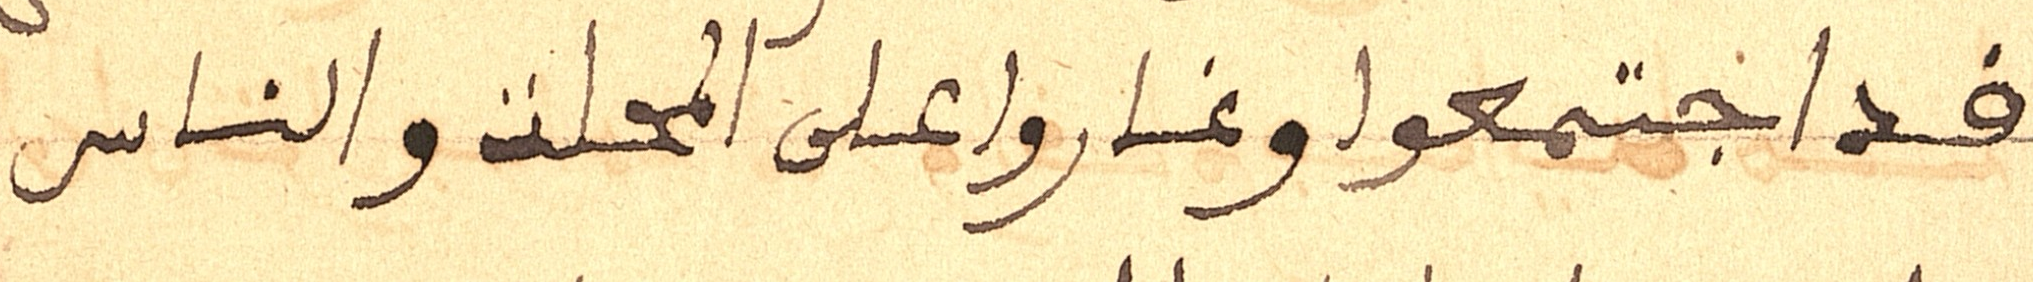قد اجتمعوا وغاروا على المحلة والناس
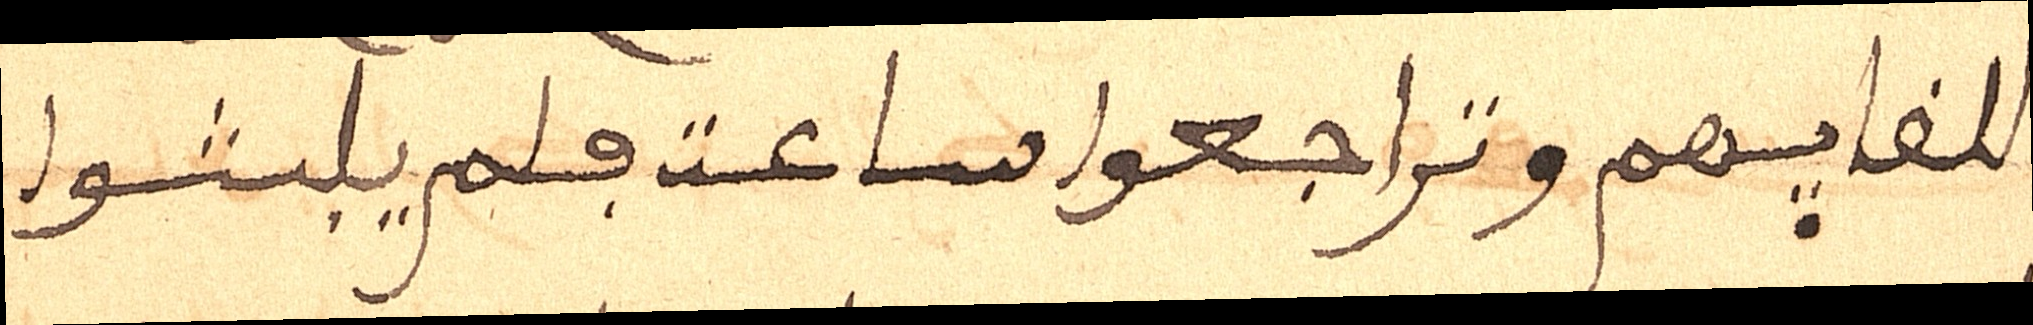القائهم وتراجعوا ساعة فلم يلبثوا
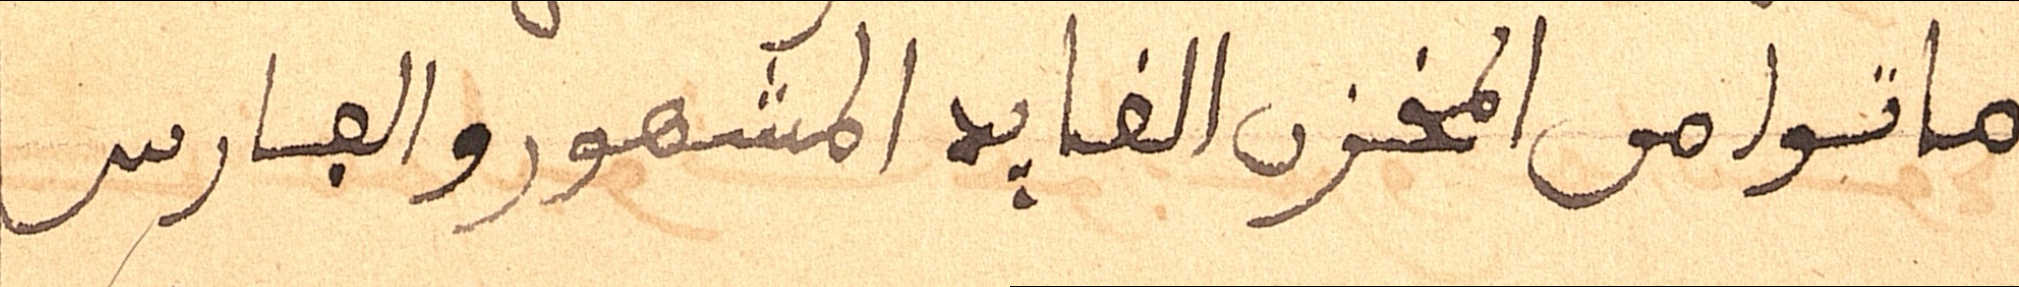ماتوا من المخزن القائد المشهور والفارس
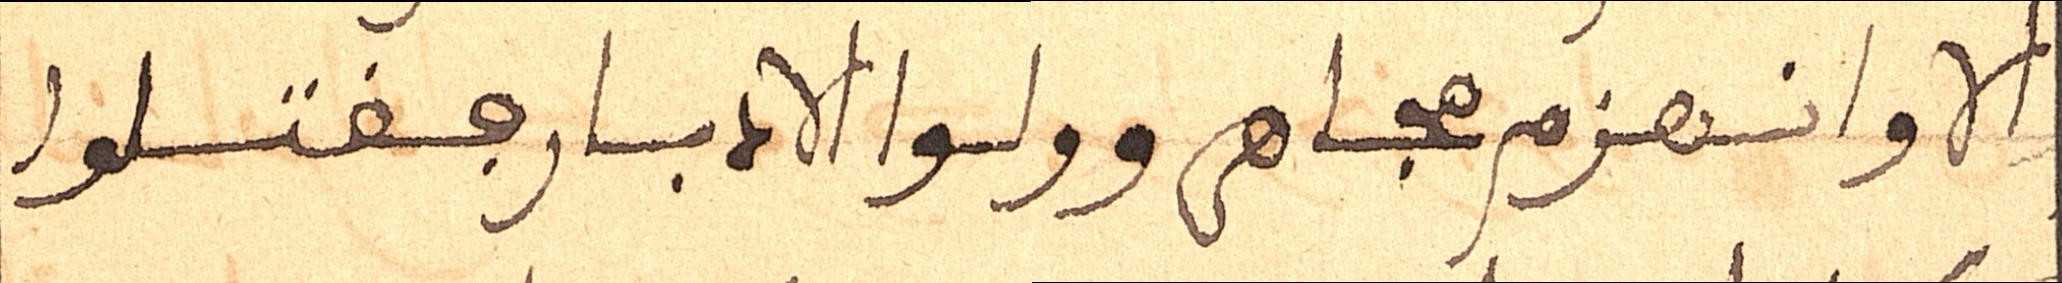الاوا نهزم مجاهر وولوا الادبار فقتلوا
